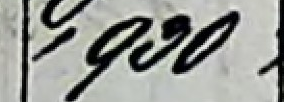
0,930
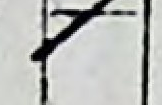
7
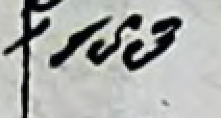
0,153
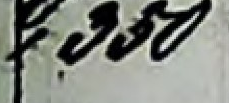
0,350
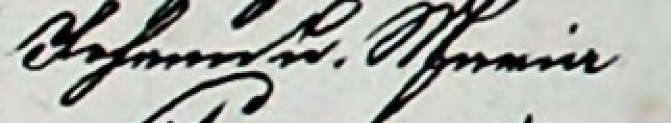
Johann u. Maria
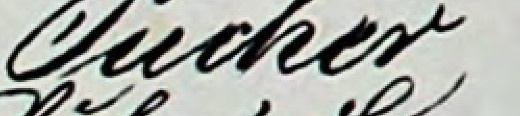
Pucher
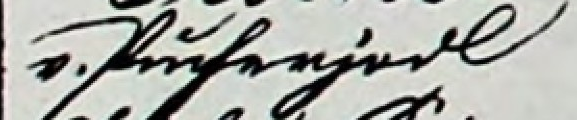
v. Pucherjodl
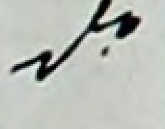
do
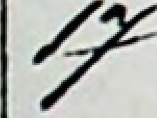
17
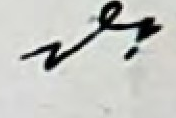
do
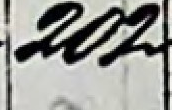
202
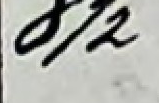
8 ½
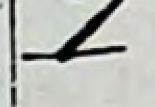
I
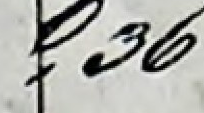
0,36
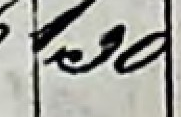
1,30
